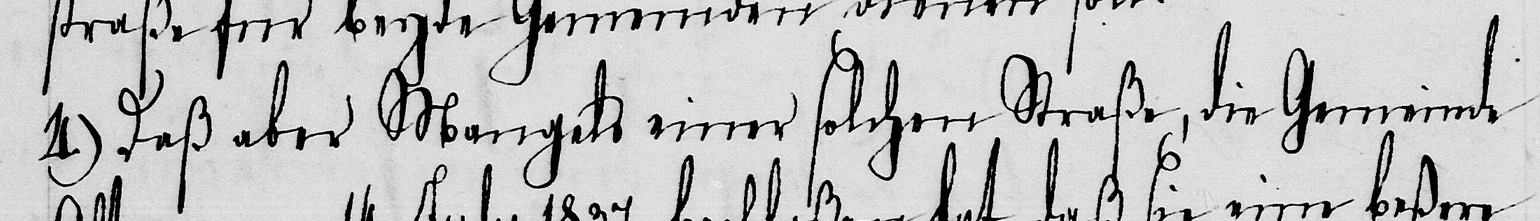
4.) Daß aber Mangels einer solchen Straße, die Gemeinde
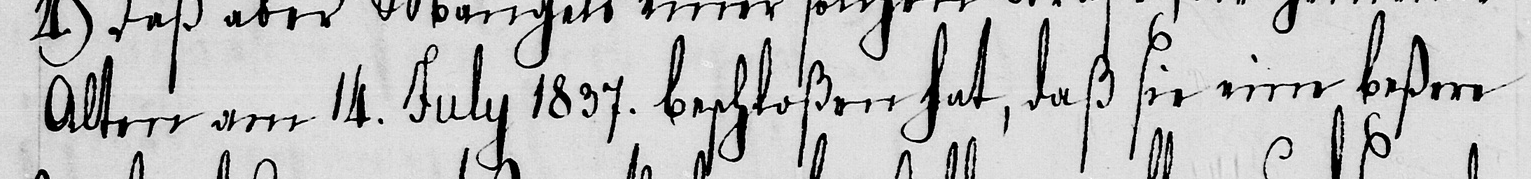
Alten am 14. July 1837. beschloßen hat, daß sie eine beßere
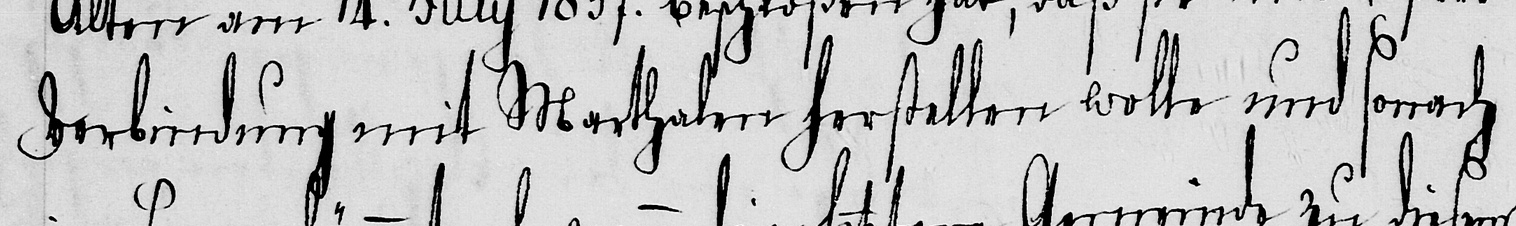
Verbindung mit Marthalen herstellen wolle und sonach
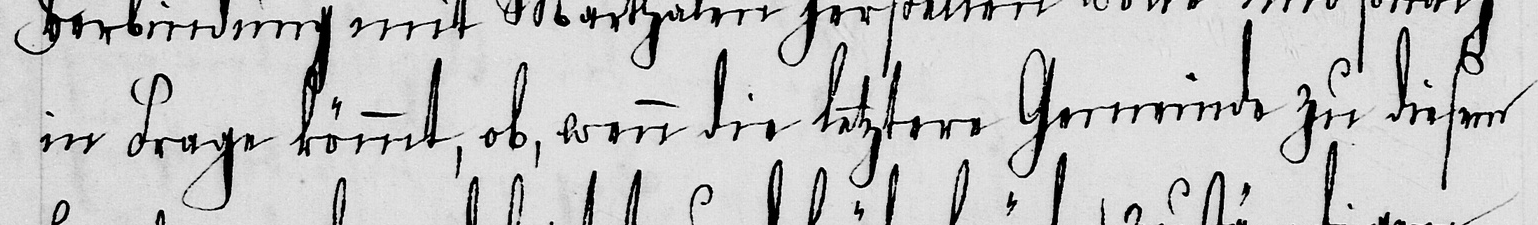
in Frage kömmt, ob, wenn die letztere Gemeinde zu diesem
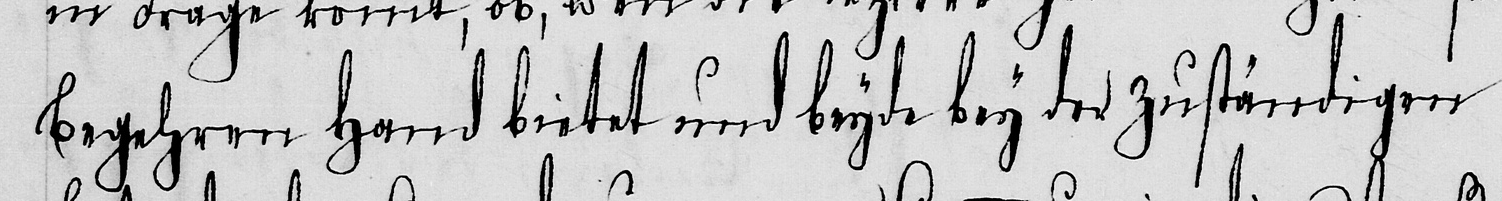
Begehren Hand bietet und beyde bey der Zuständigen
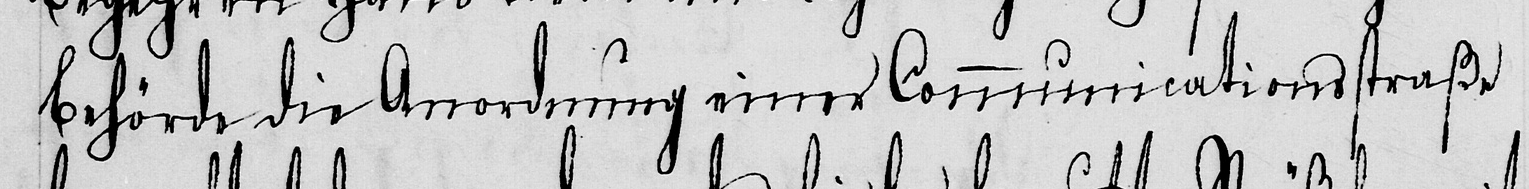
Behörde die Anordnung einer Communicationsstraße
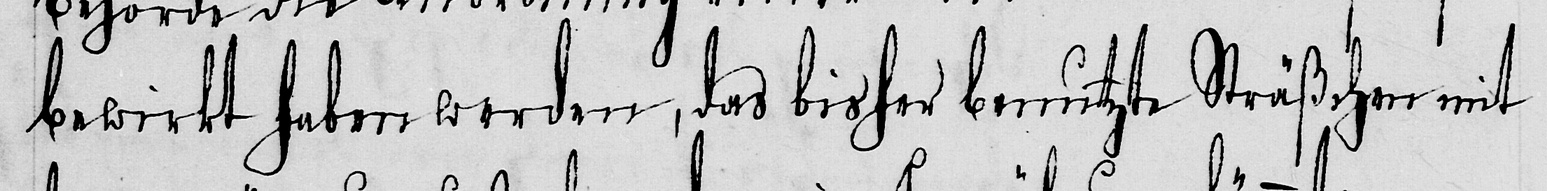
bewirkt haben werden, das bisher benutzte Sträßchen mit
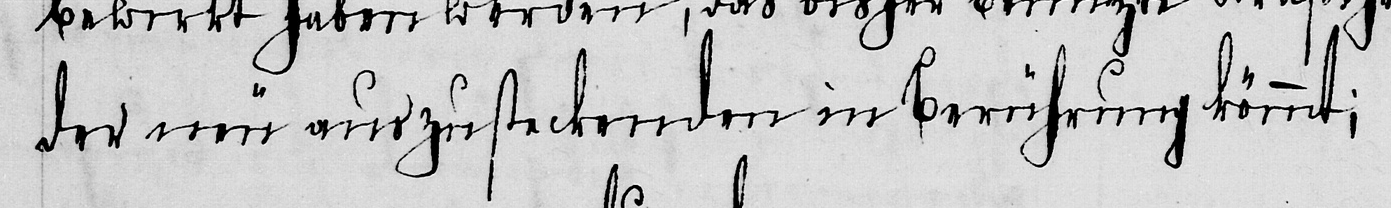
der neu auszusteckenden in Berührung kömmt;
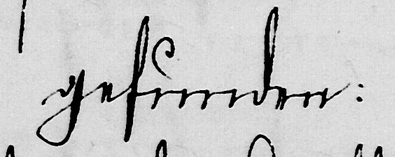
gefunden:
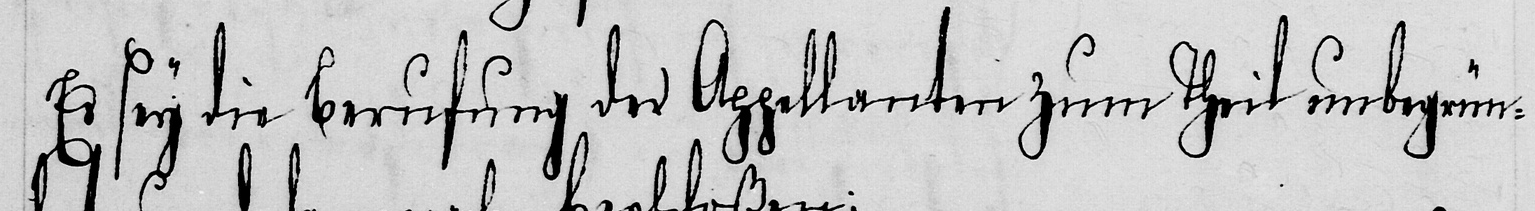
Es sey die Berufung der Appellanten zum Theil unbegrü¬
